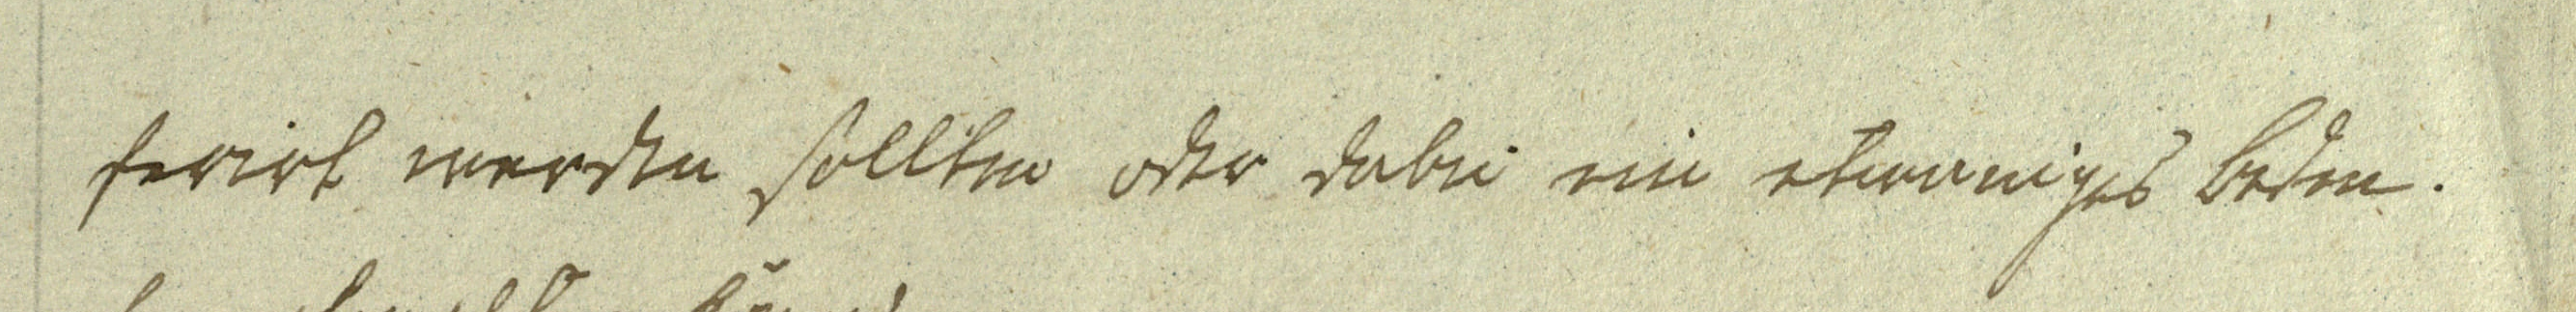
servirt werden sollten oder dabei ein etwaniges beden¬
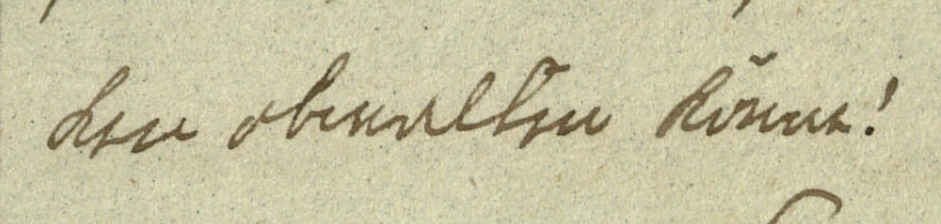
ken obwalten könne?
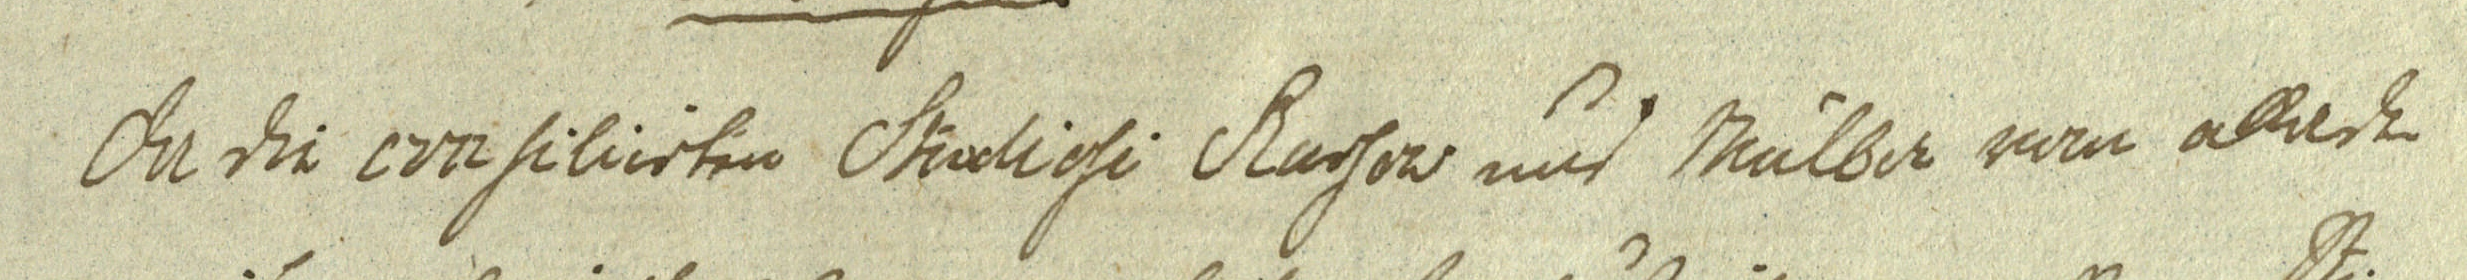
Da die consiliirten Studiosi Rassow und Müller vom akade¬
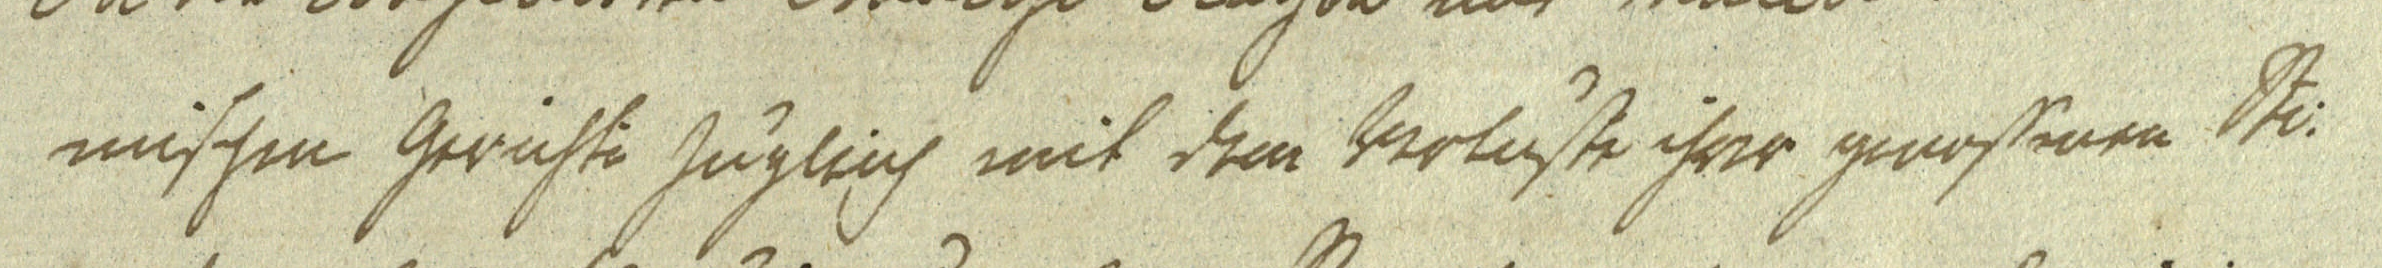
mischen Gerichte zugleich mit dem Verluste ihrer genossenen Sti¬
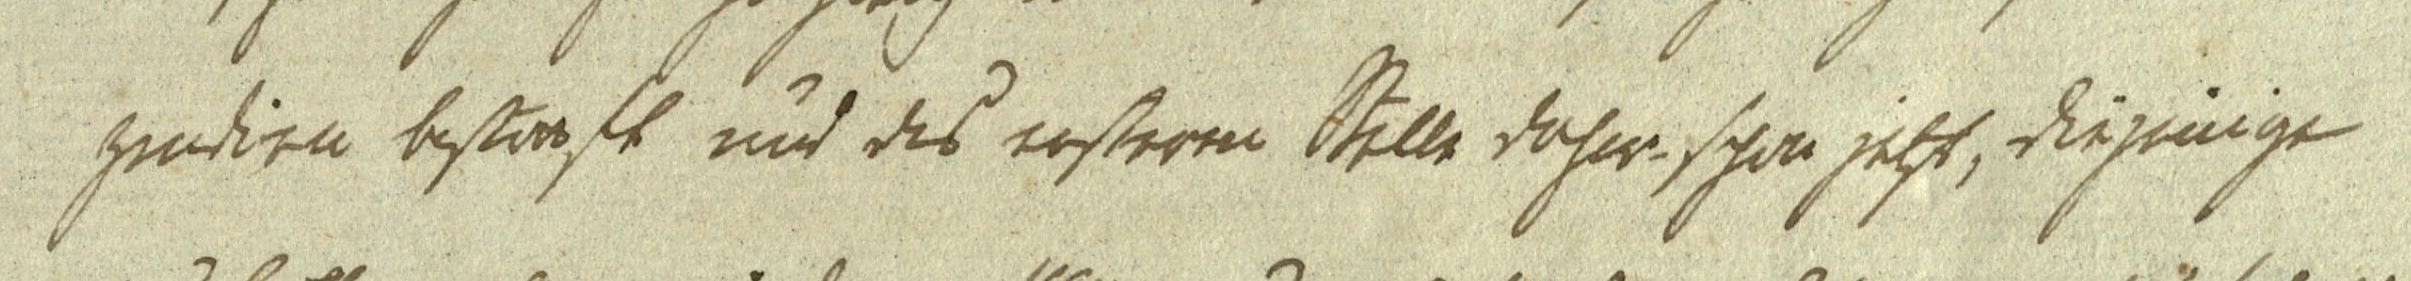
pendien bestraft und des ersteren Soll, daher schon jetzt, diejenige
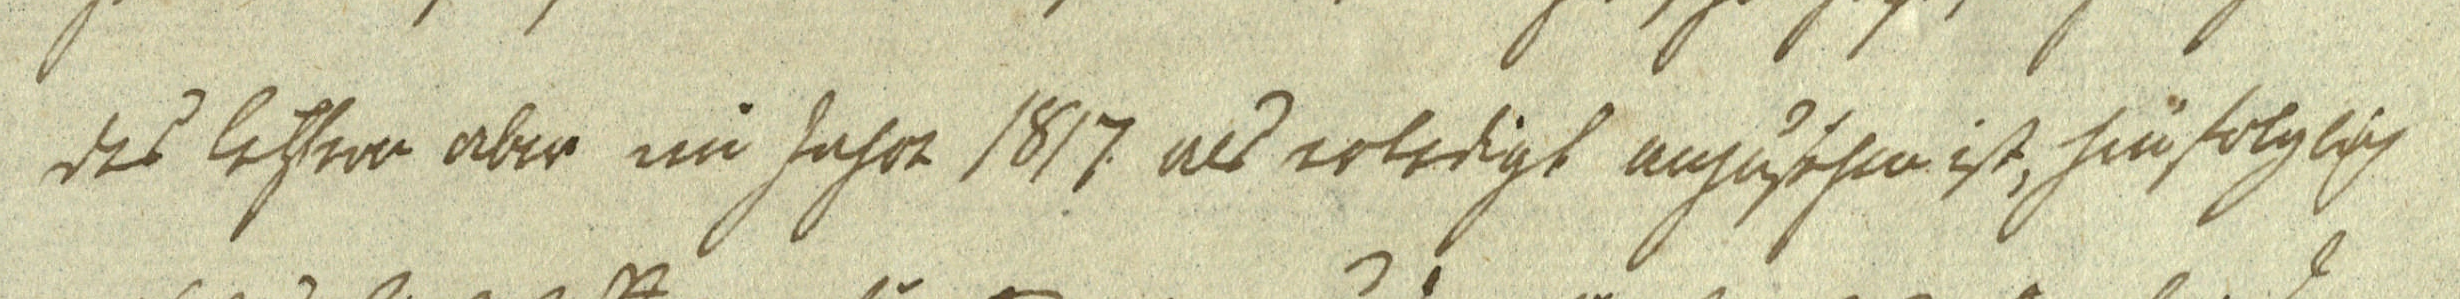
des letztern aber im Jahre 1817 als erledigt anzusehen ist, hinfolglich
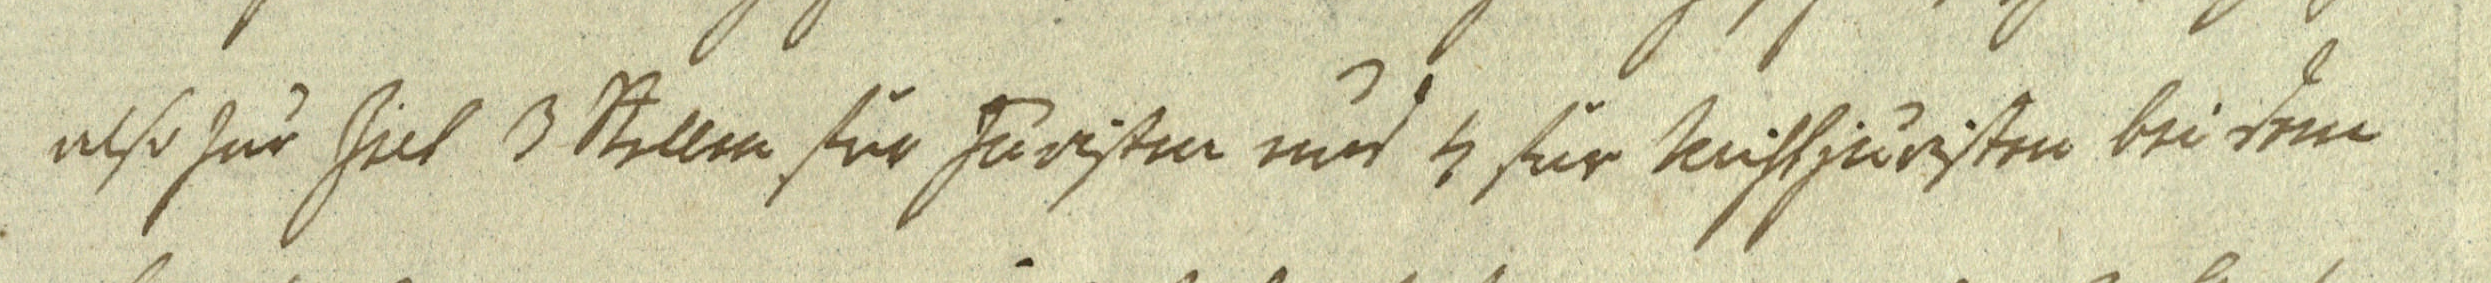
also zur Zeit 3 Stellen für Juristen und 4 für Nichtjuristen bei dem
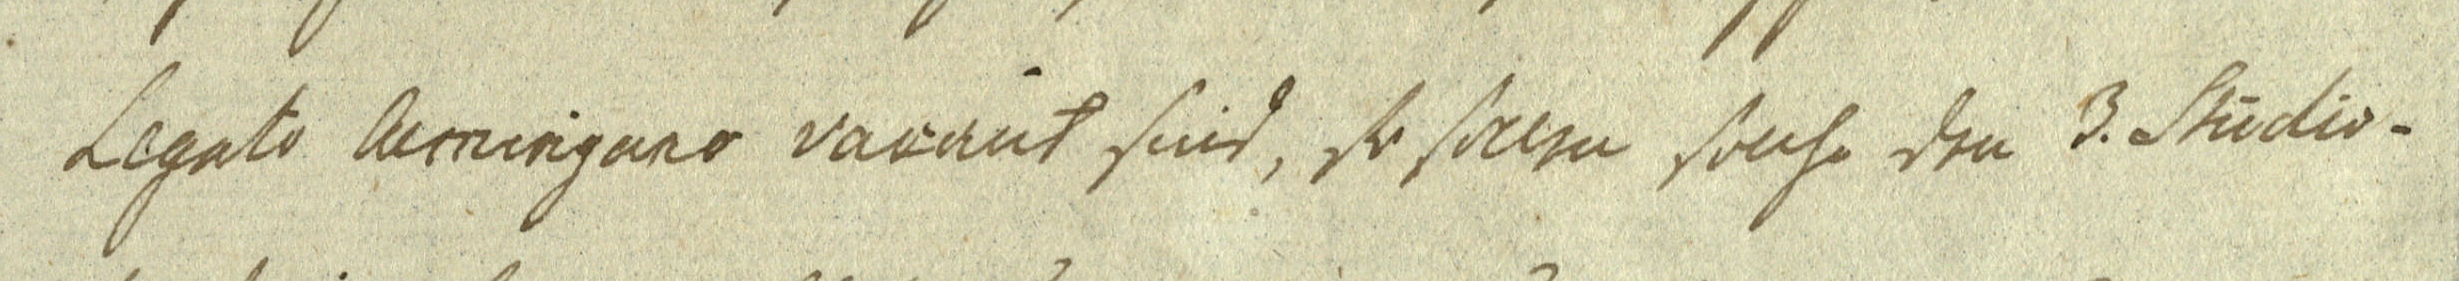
Legato Aemingano vacant sind, so sollen solche den 3. Studio¬
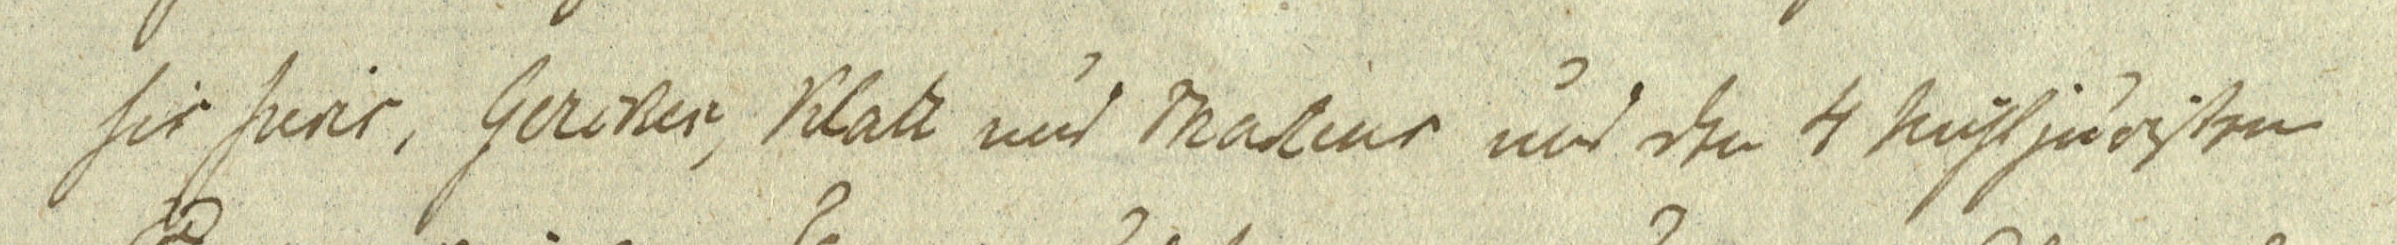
sis Juris, Gercker, Klatt und Martens und den 4 Nichtjuristen
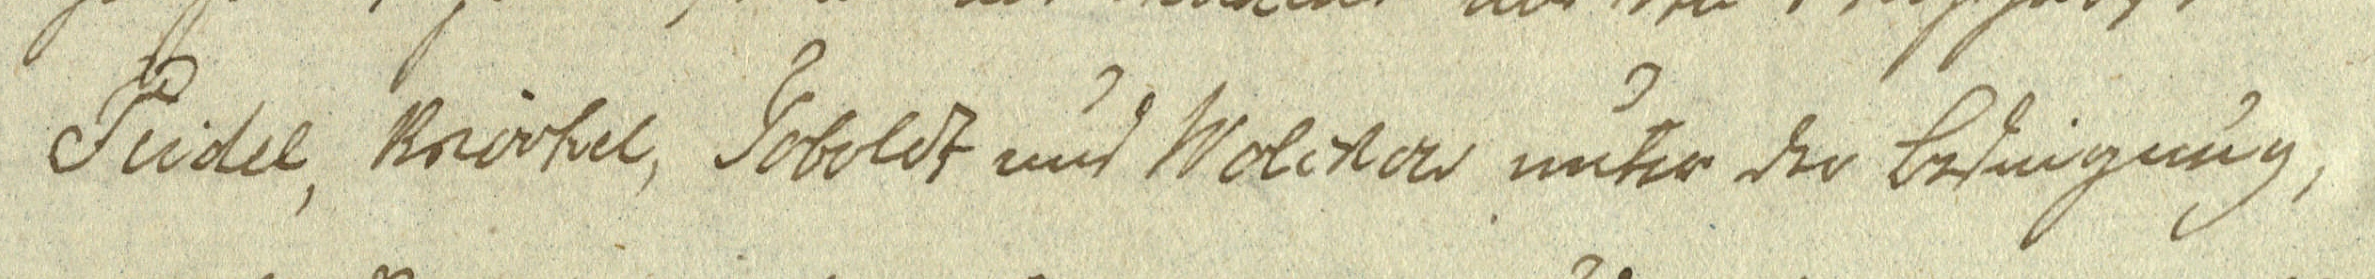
Seidel, Knöchel, Toboldt und Wolckow unter der Bedingung,
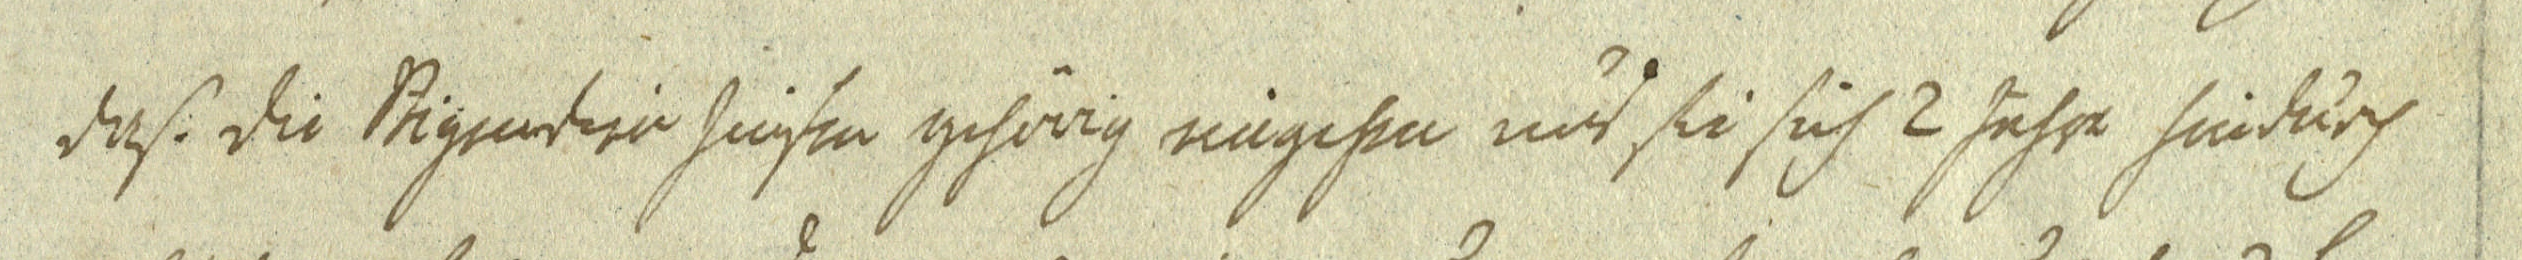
daß. die Stipendien Zinsen gehörig eingehen und sie sich 2 Jahre hindurch
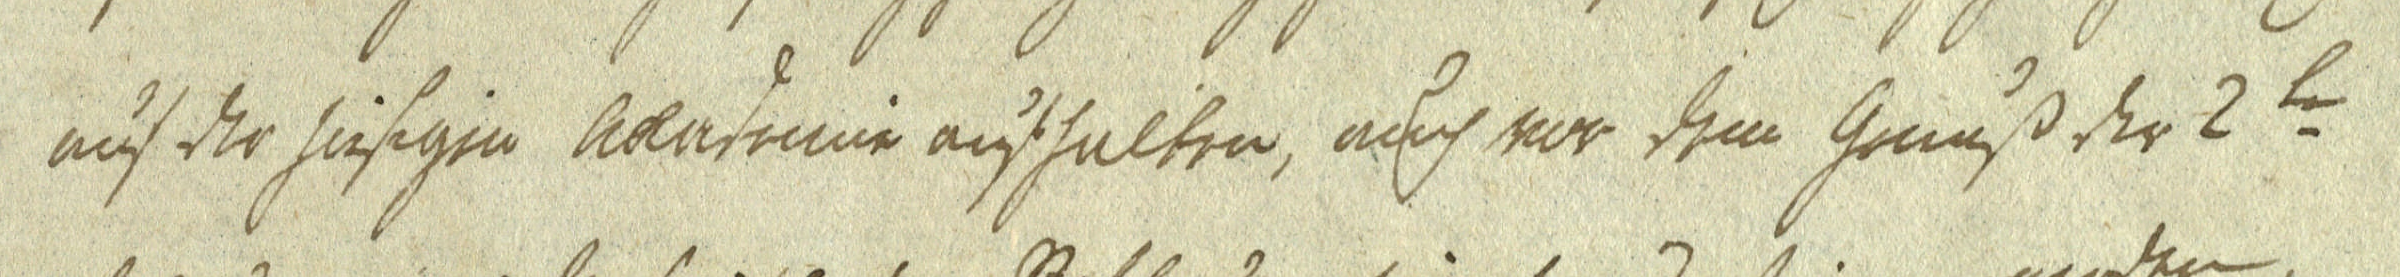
auf der hiesigen Akademie aufhalten, auch vor dem Genuß der 2 ten
